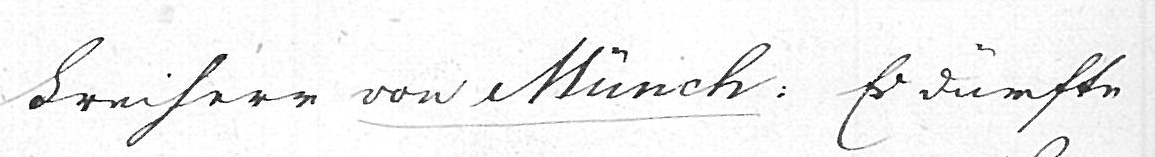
Freiherr von Münch: Es dürfte
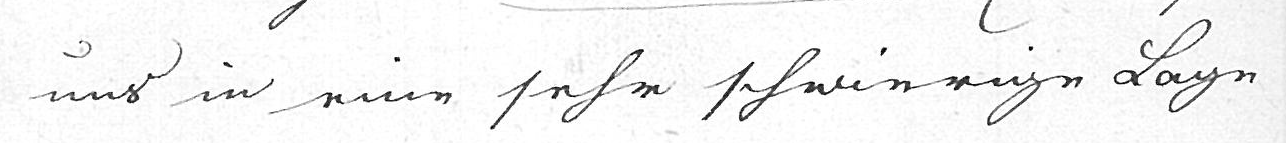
uns in eine sehr schwierige Lage
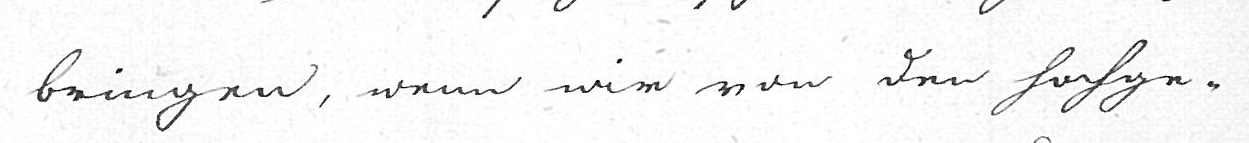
bringen, wenn wir von den hochge-
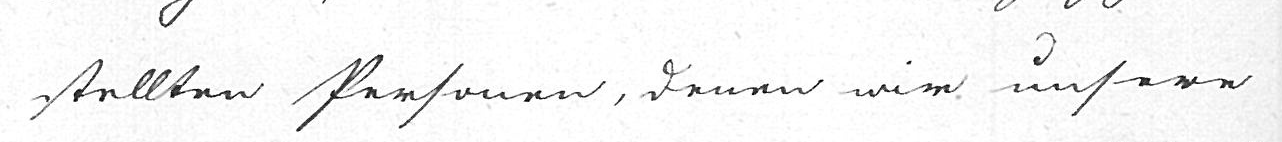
stellten Personen, denen wir unsere
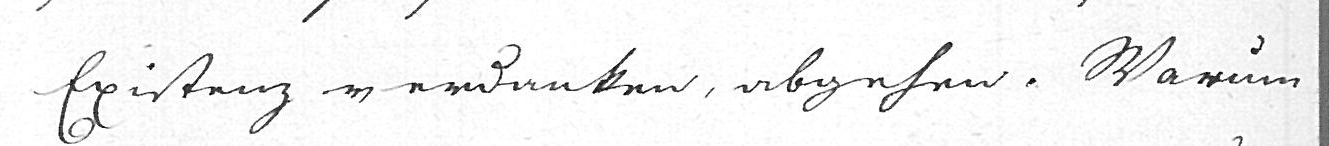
Existenz verdanken, abgehen. Warum
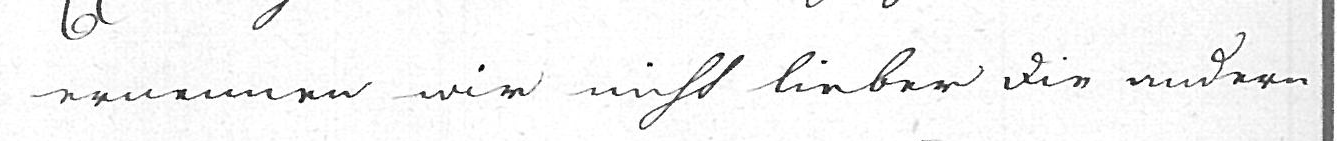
ernennen wir nicht lieber die andern
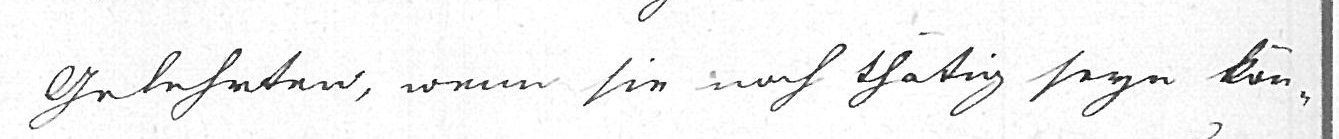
Gelehrten, wenn sie noch thätig seyn kön-
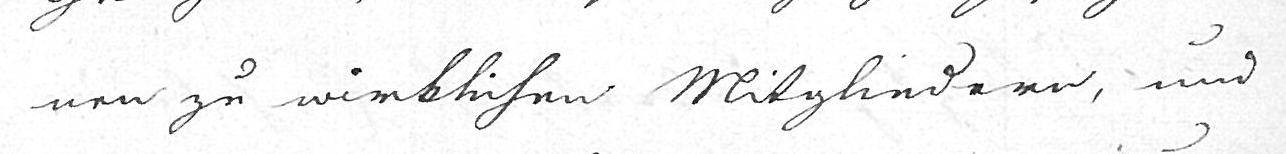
nen zu wirklichen Mitgliedern, und
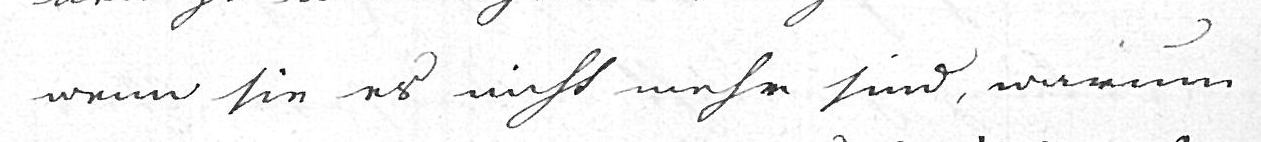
wenn sie es nicht mehr sind, warum
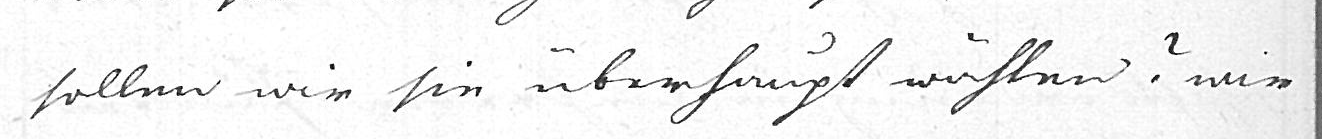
sollen wir sie überhaupt wählen? Wir
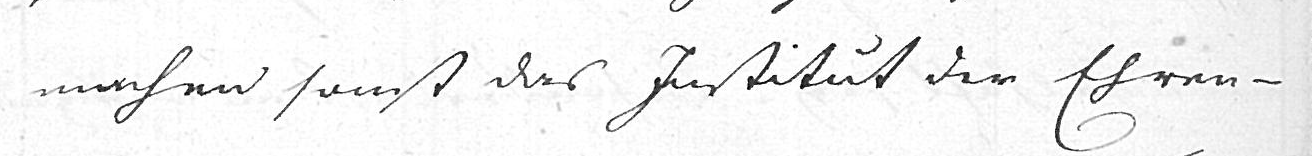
machen sonst das Institut der Ehren-
